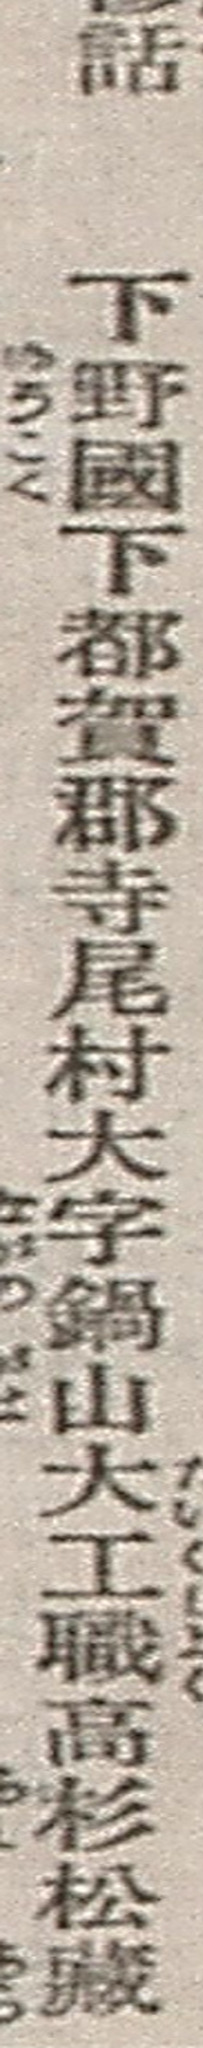○水難惨話下野国都下賀郡寺尾村大字鍋山大工職高杉松蔵
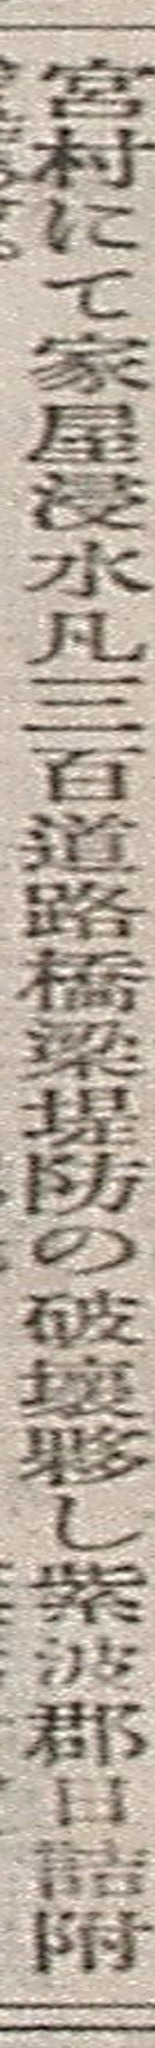宮村にて家屋浸水凡三百道路橋梁堤防の破壊夥し紫波郡日詰附
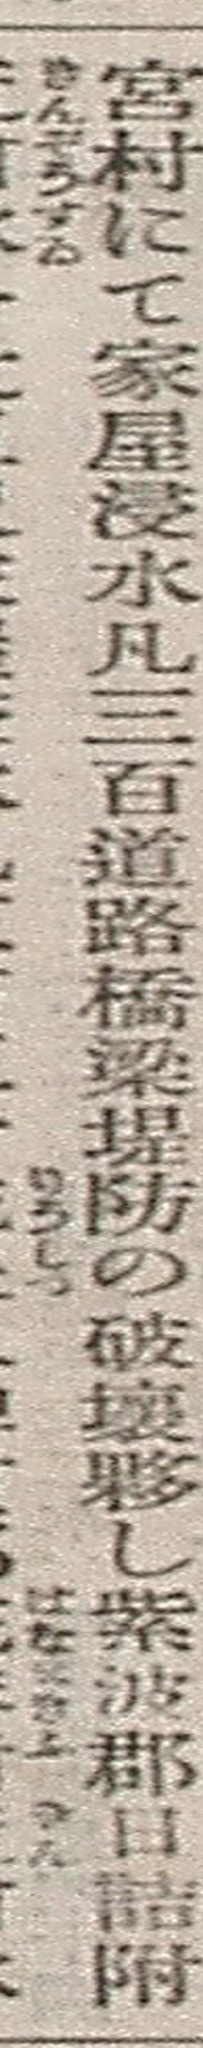宮村にて家屋浸水凡三百道路橋梁堤防の破壊夥し紫波郡日詰附
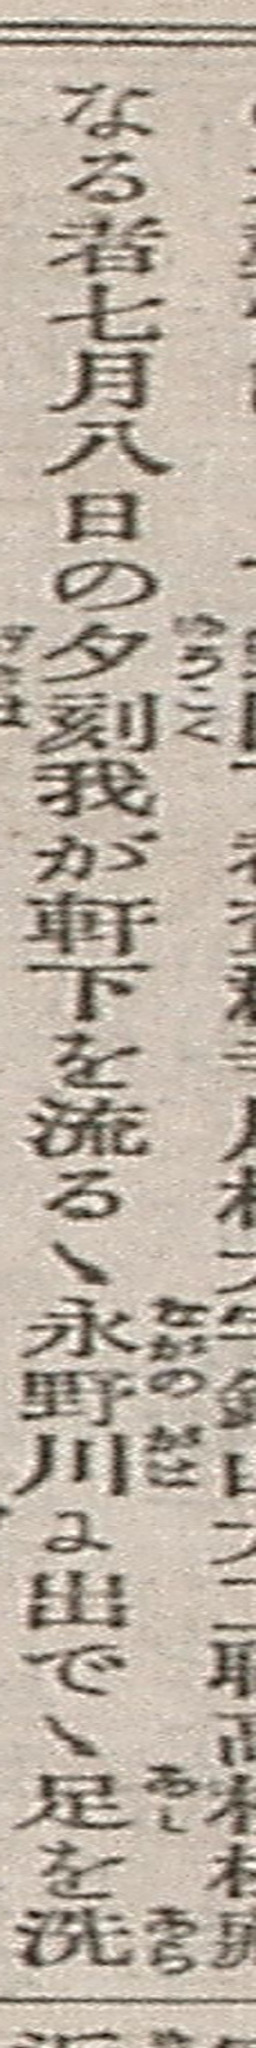なる者七月八日の夕刻我が軒下を流るゝ永野川に出でゝ足を洗
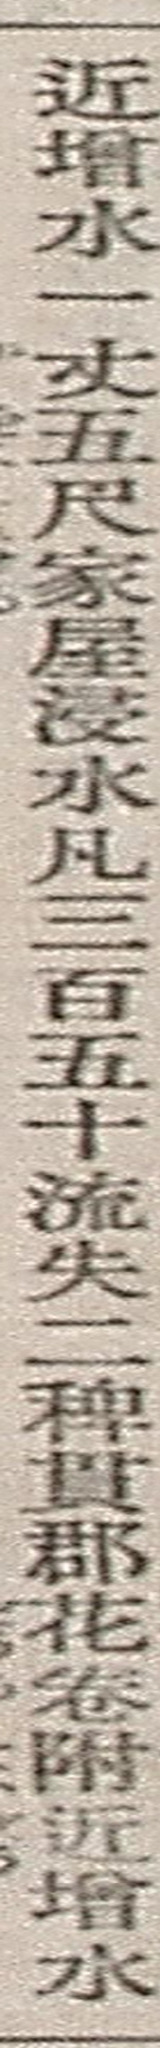近増水一丈五尺家屋浸水凡三百五十流失二稗貫郡花巻附近増水
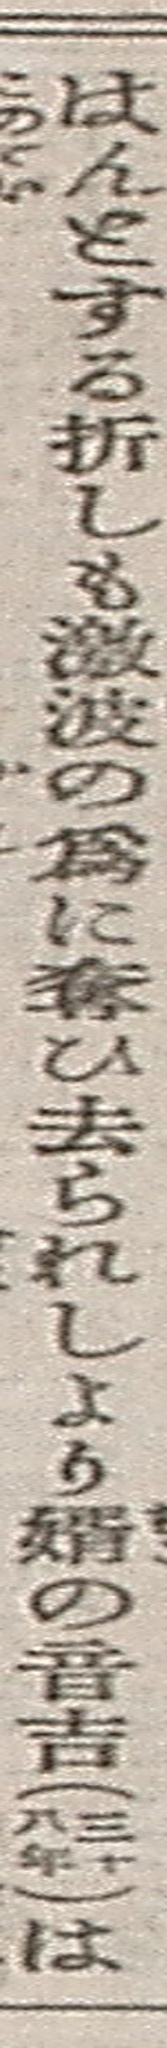はんとする折しも激波の為に奪ひ去られしより婿の音吉三十八年は
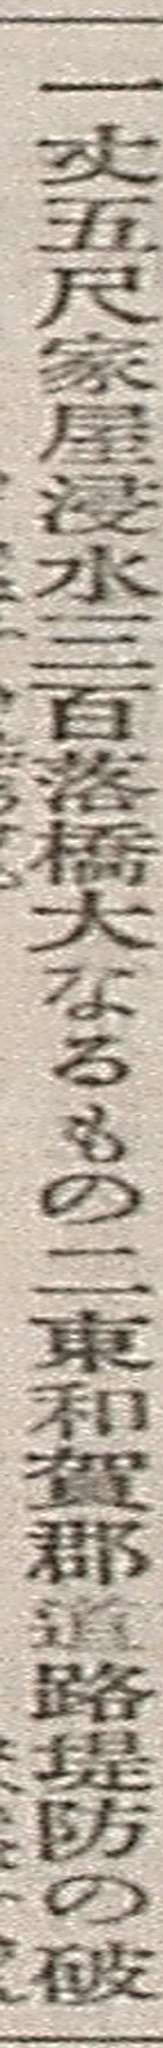一丈五尺家屋浸水三百落橋大なるもの二東和賀郡道路堤防の破
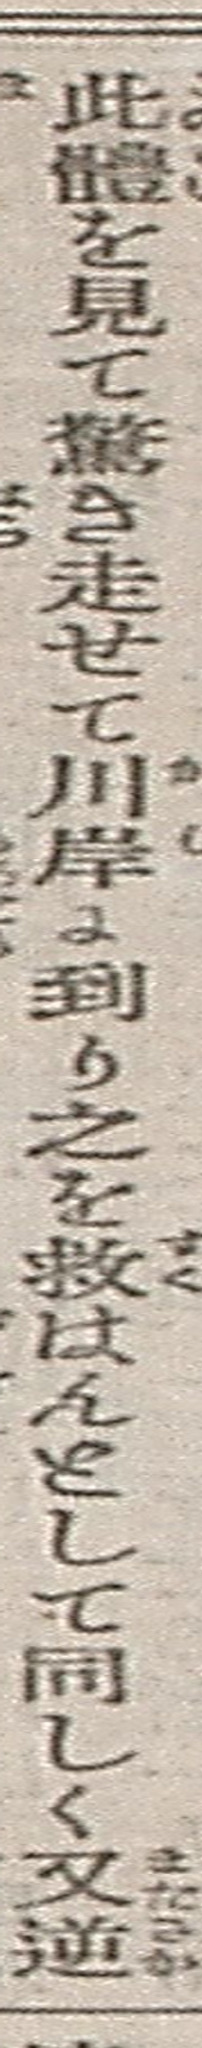此体を見て驚き走せて河岸に到り之を救はんとして同しく亦逆
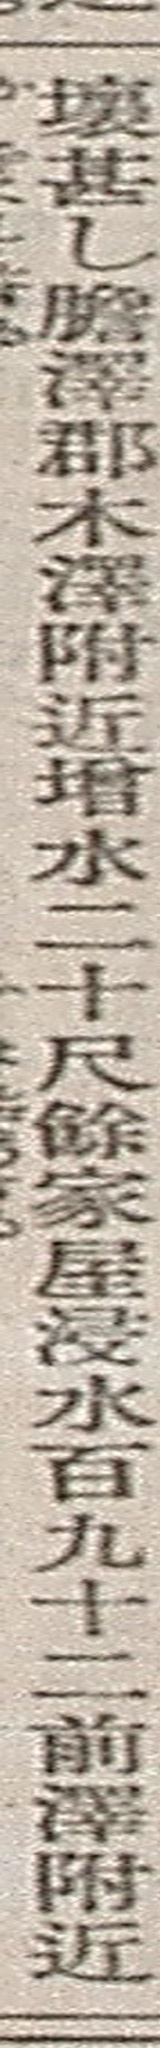壊甚し膽沢郡木沢附近増水二十尺餘家屋浸水百九十二前沢附近
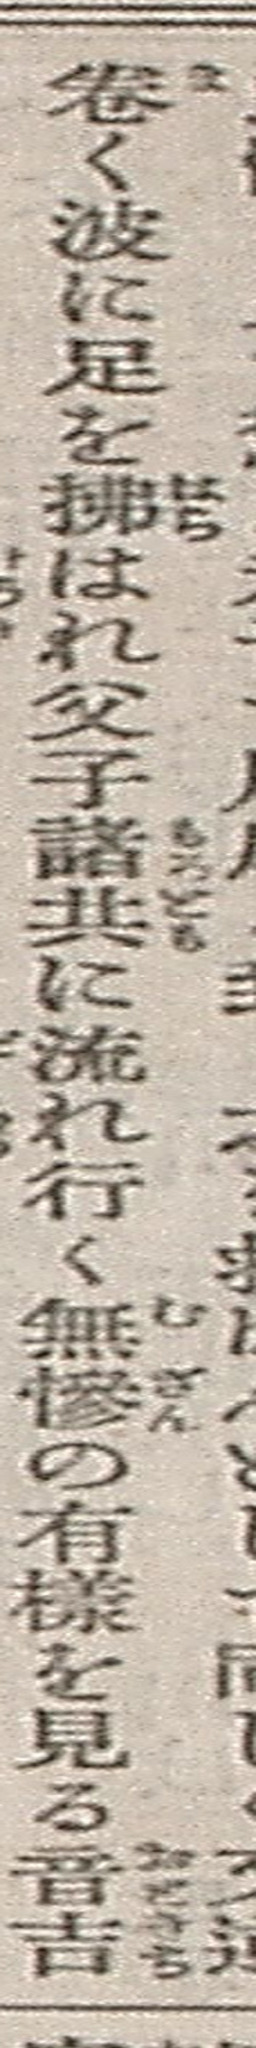巻く波に足を払はれ父子諸共に流れ行く無惨の有様を見る音吉
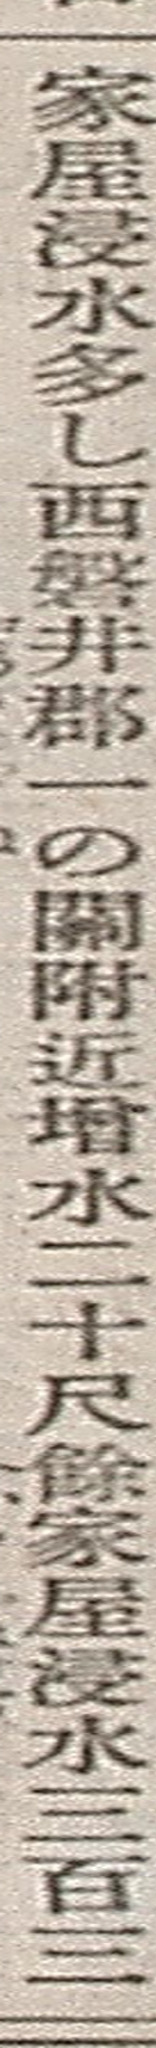家屋浸水多し西盤井郡一の関附近増水二十尺餘家屋浸水三百三
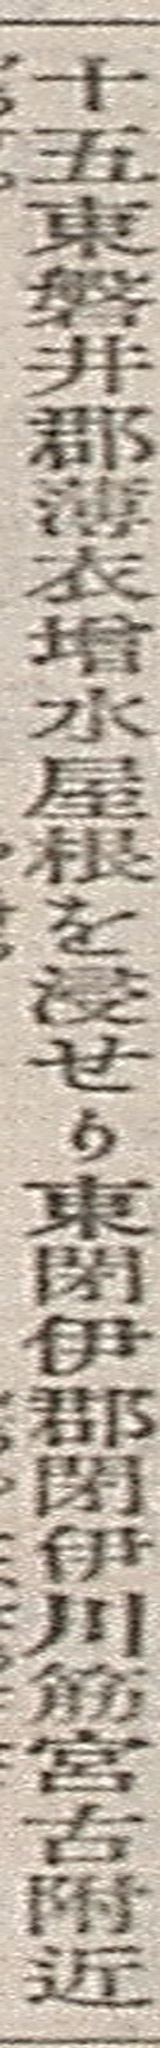十五東盤井郡薄衣増水屋根を浸せり東閉伊郡閉伊川筋宮古附近
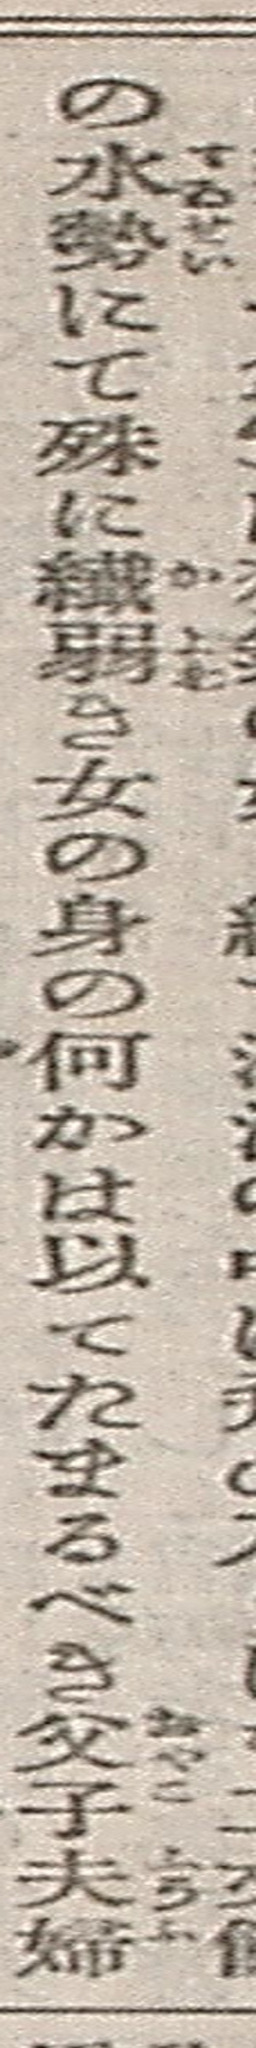の水勢にて殊に織弱き女の身の何かは以てたまるべき父子夫婦
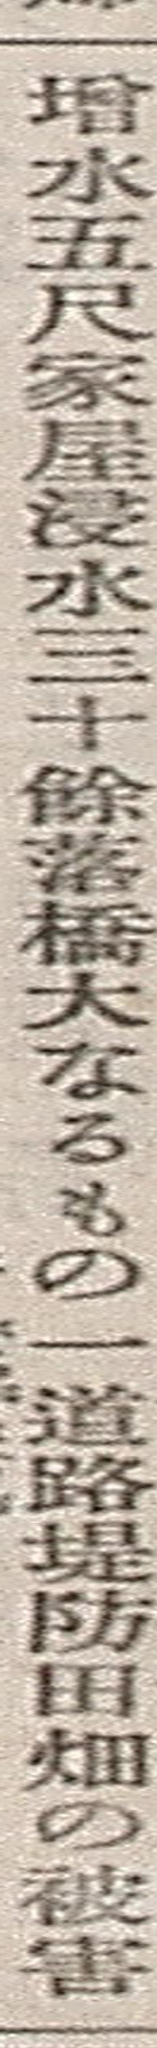増水五尺家屋浸水三十餘落橋大なるもの一道路堤防田畑の被害
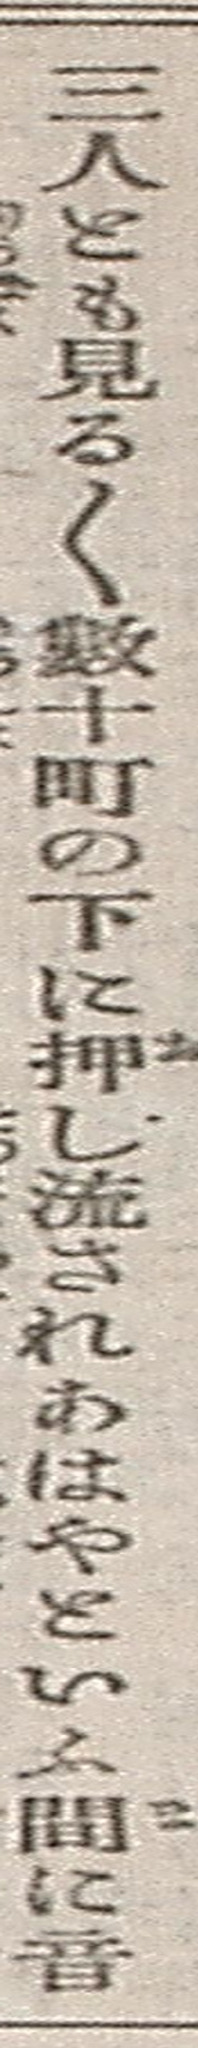三人とも見る〳〵数十町の下に押し流されあはやといふ間に音
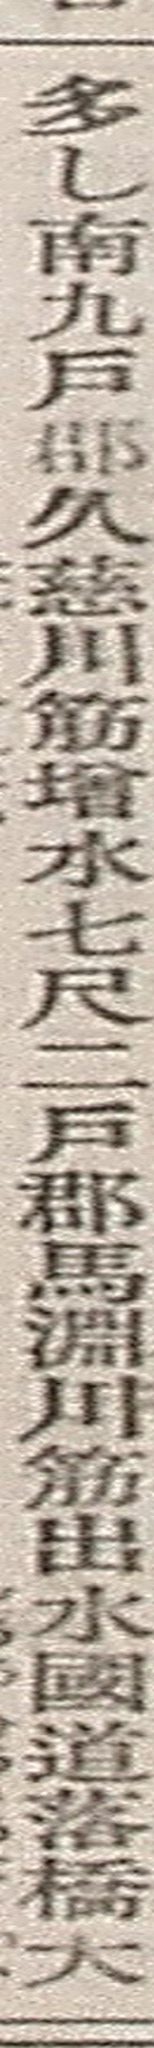多し南九戸郡久慈川筋増水七尺二戸郡馬淵川筋出水国道落橋大
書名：風俗畫報臨時増刊第百二十八號　洪水被害録（下）
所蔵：東京大学地震研究所図書室 Earthquake Research Institute Library, The University of Tokyo, JAPAN
